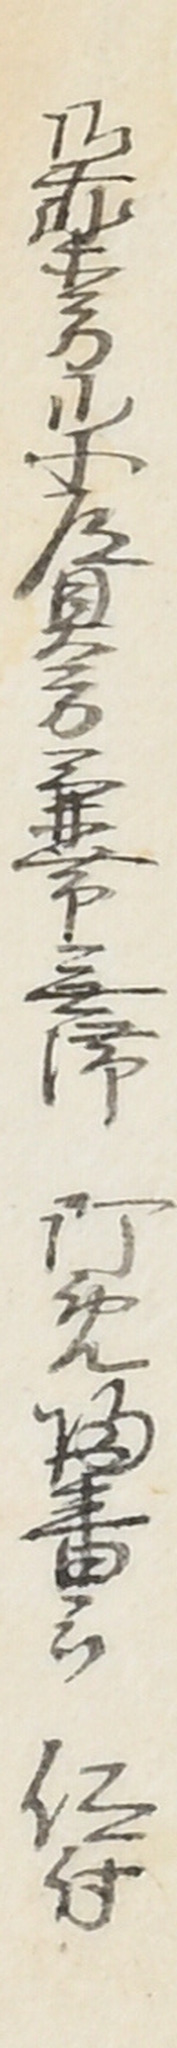御普請御小道具方兼帯無滞御免帰番被仰付

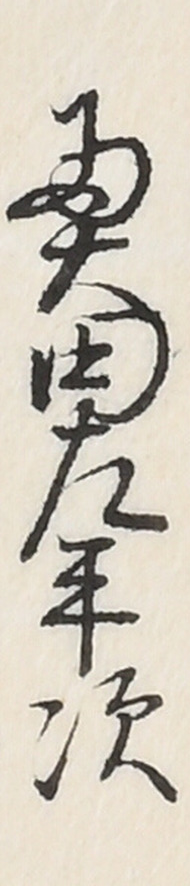奥田左平次
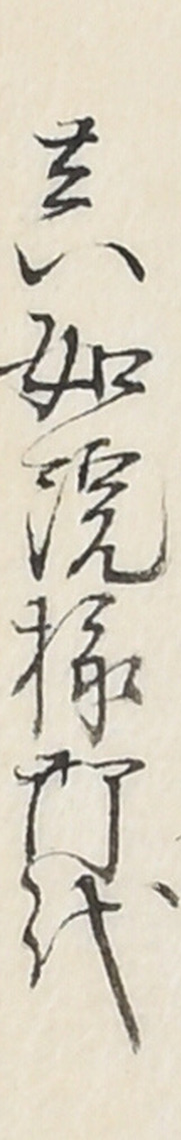真如院様御代
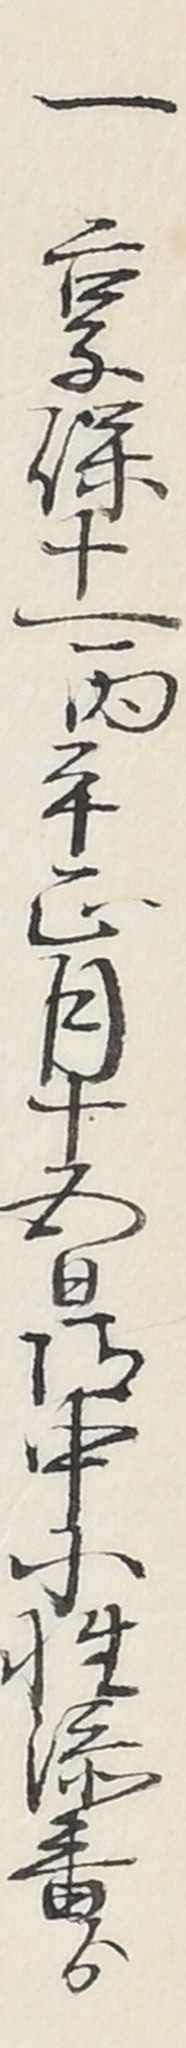一享保十一丙午正月十五日御中小性添番ゟ
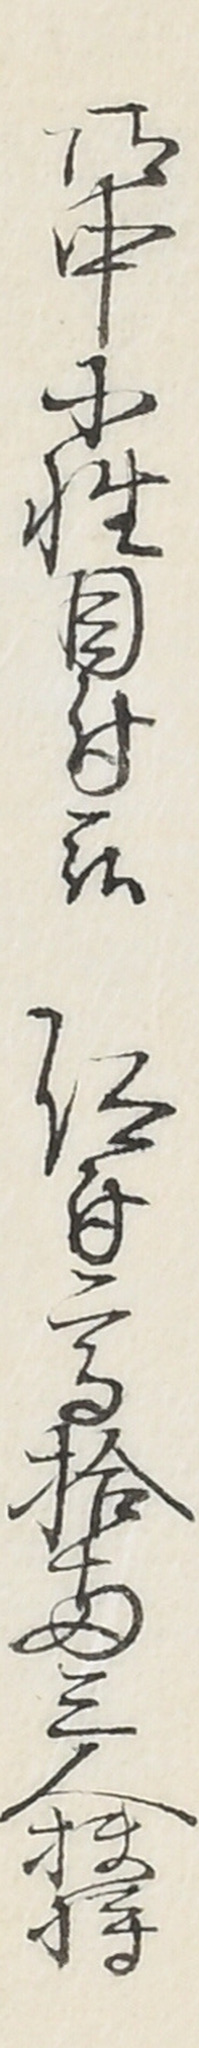御中小性目付被仰付高拾両三人扶持
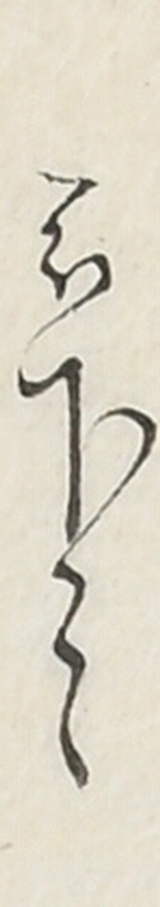召下之
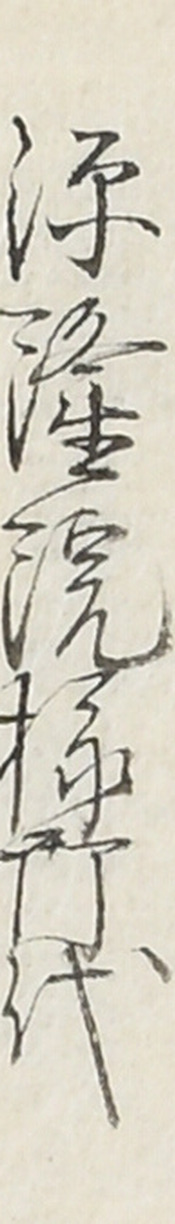源隆院様御代
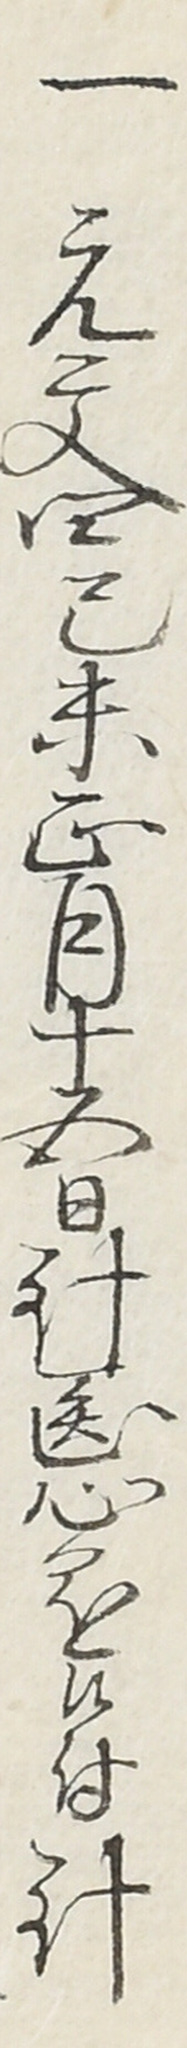一元文四己未正月十五日針医心懸候付針
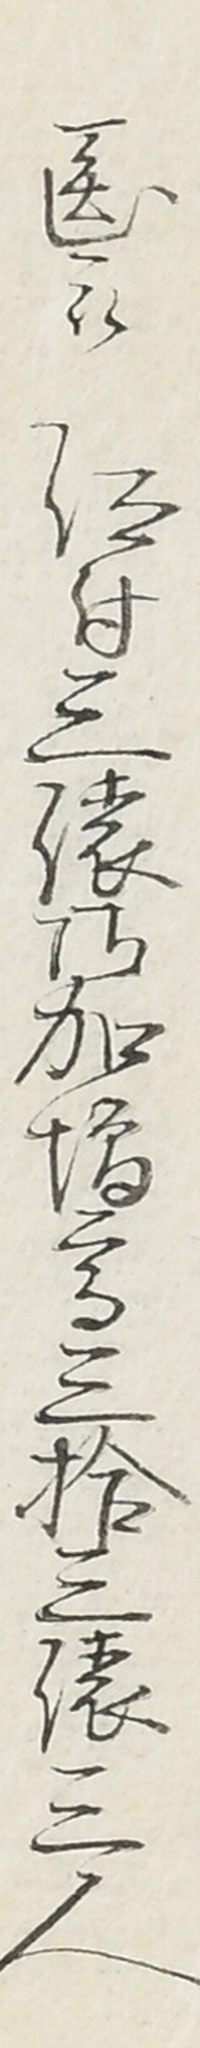医被仰付三俵御加増高三拾三俵三人
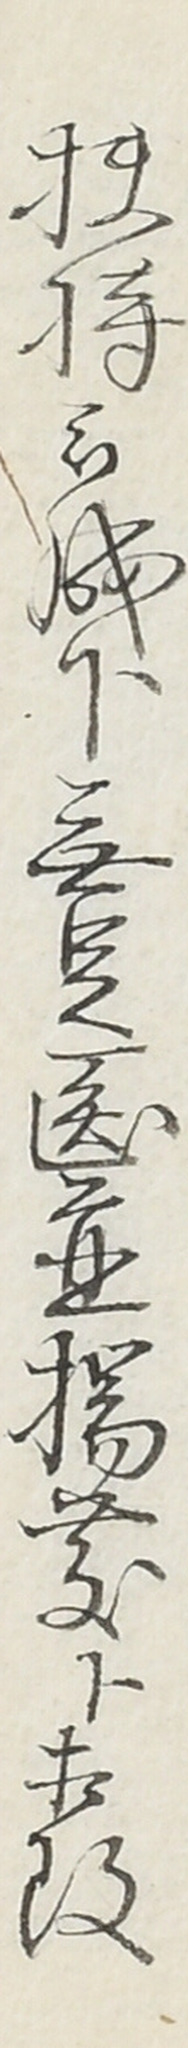扶持被成下無足医並揚慶ト相改
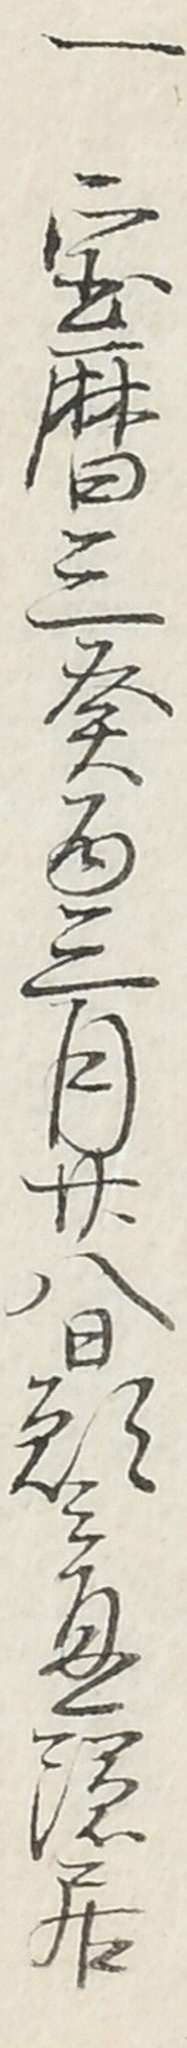一宝暦三癸酉三月廿八日願之通隠居
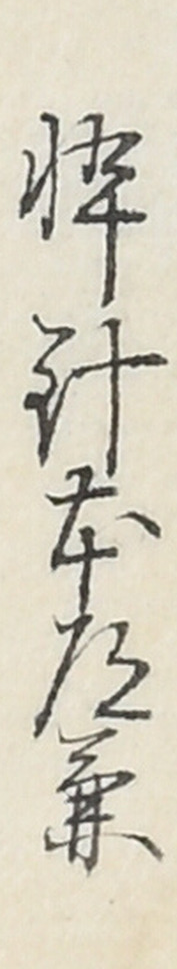忰針本道兼
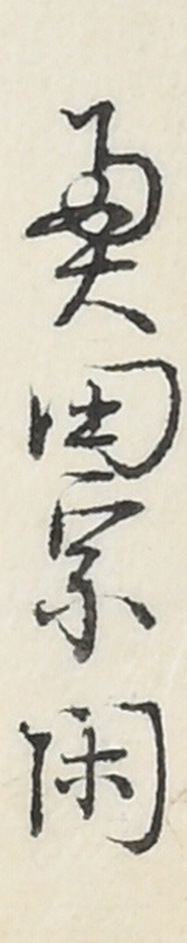奥田宗閑

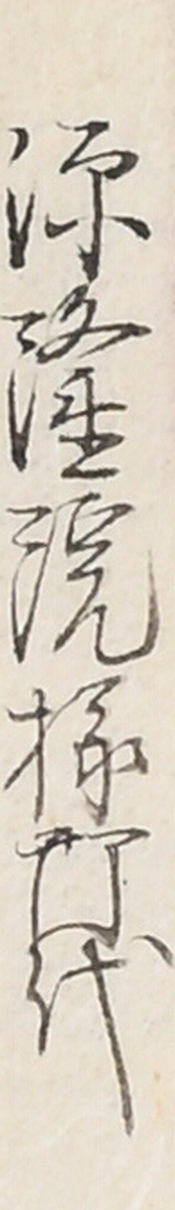源隆院様御代
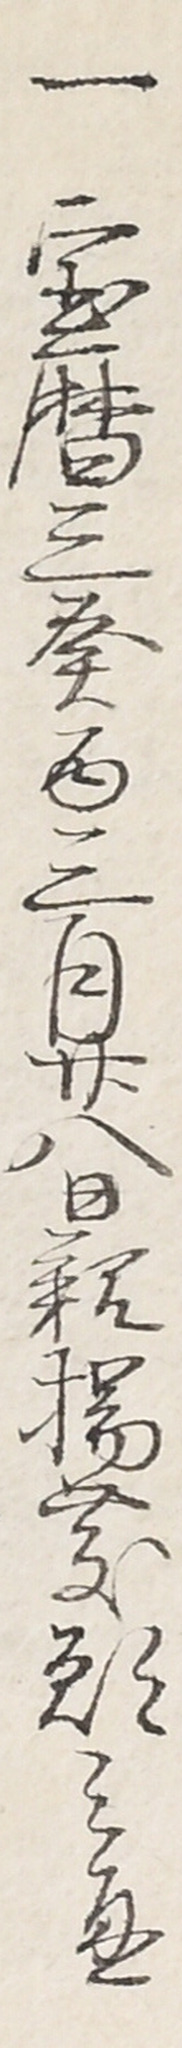一宝暦三癸酉三月廿八日親揚慶願之通
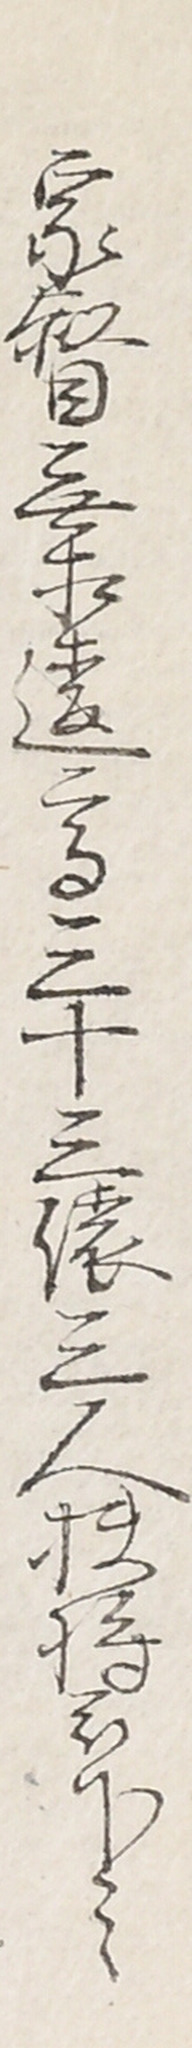家督無相違高三十三俵三人扶持被下之
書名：給人諸士勤仕録（七）
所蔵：伊那市立高遠町図書館・合同会社AMANE
